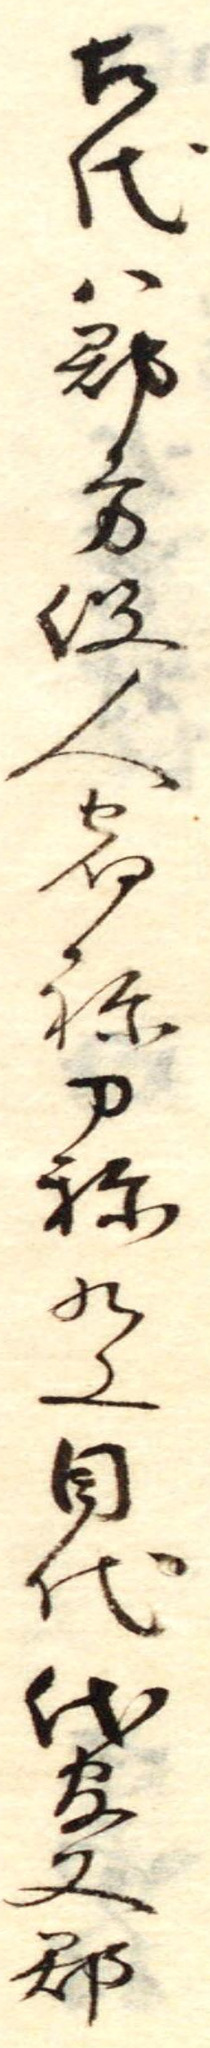古代は郡方役人宿祢刀祢九文目代代官又郡
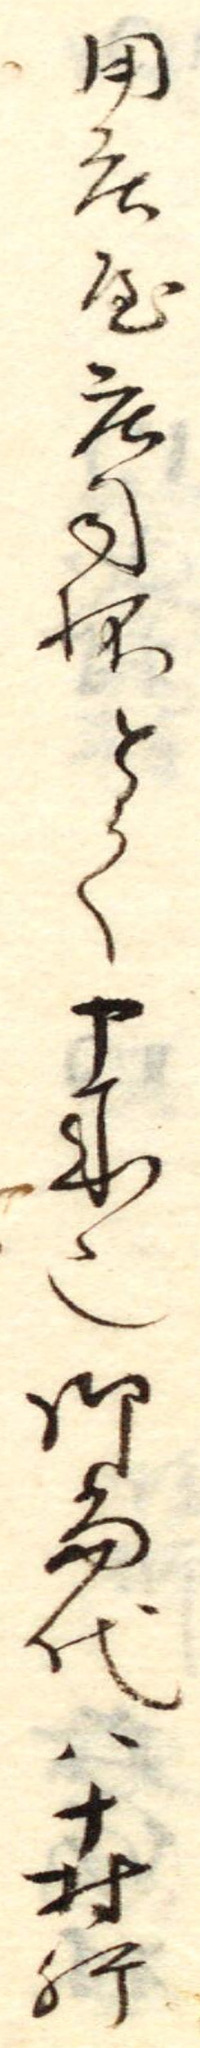用庄屋庄司抔とて申来也御当代は十村肝
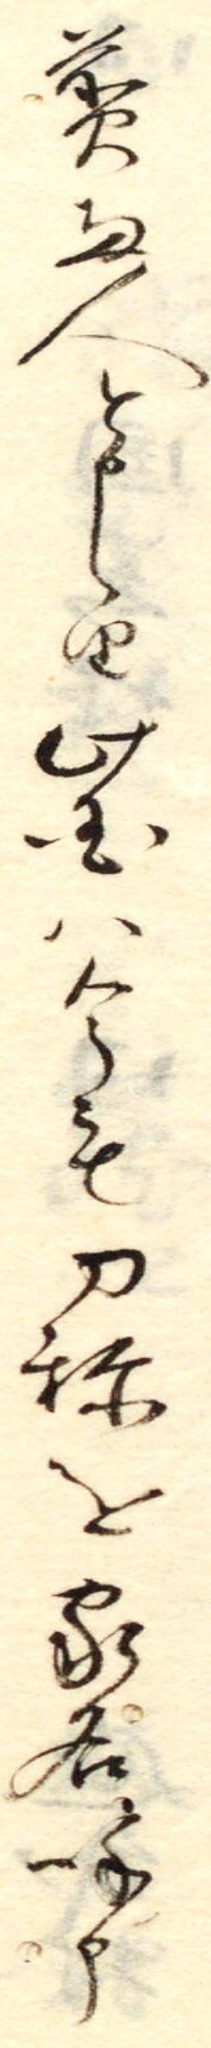煎両人と申候由此国は今も刀祢を家名呼申
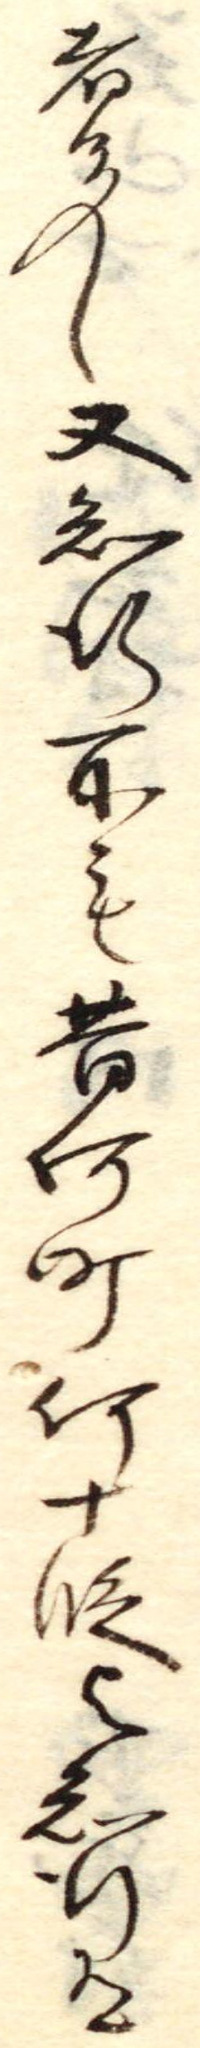者多し又知行所も昔何町何十段と知行有
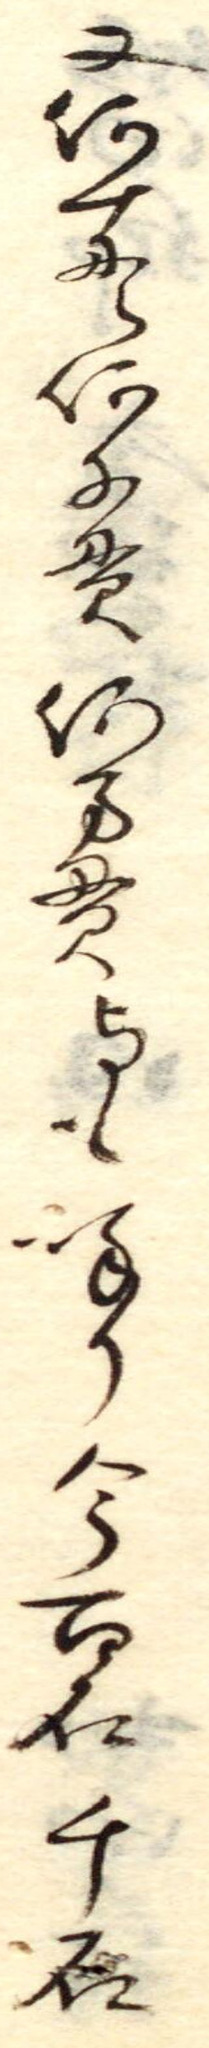又何十貫何千貫何万貫とも呼り今百石千石
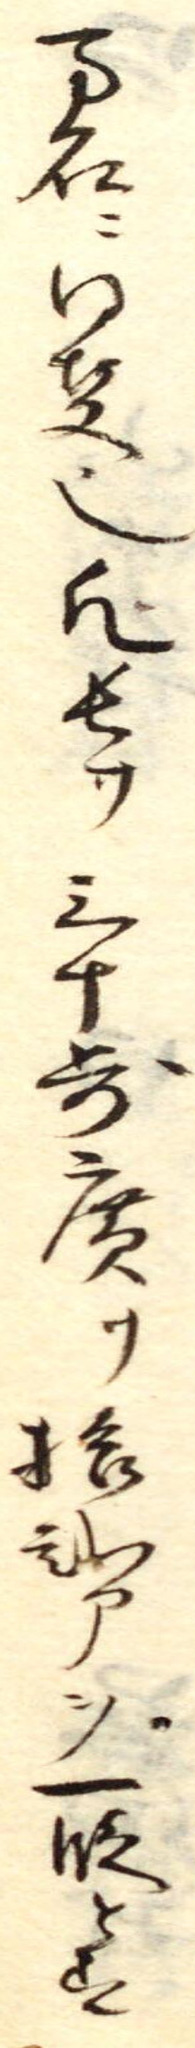万石に同事也凡長さ三十歩広さ十拾弐部を一段とす
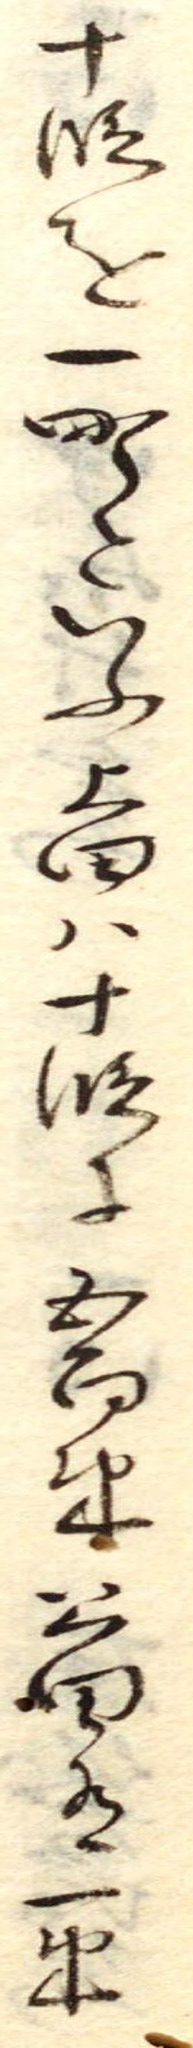十段を一町といふ上田は十段に五百束公田有一束
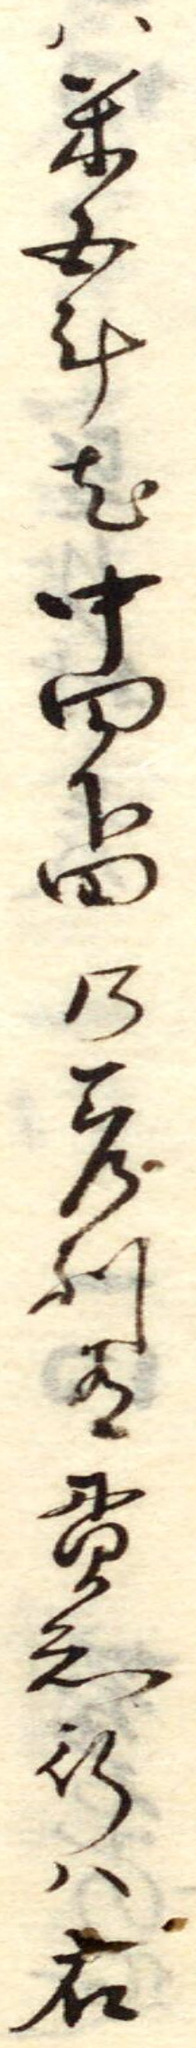は米五斗尤中田下田の差別有貫知行は右
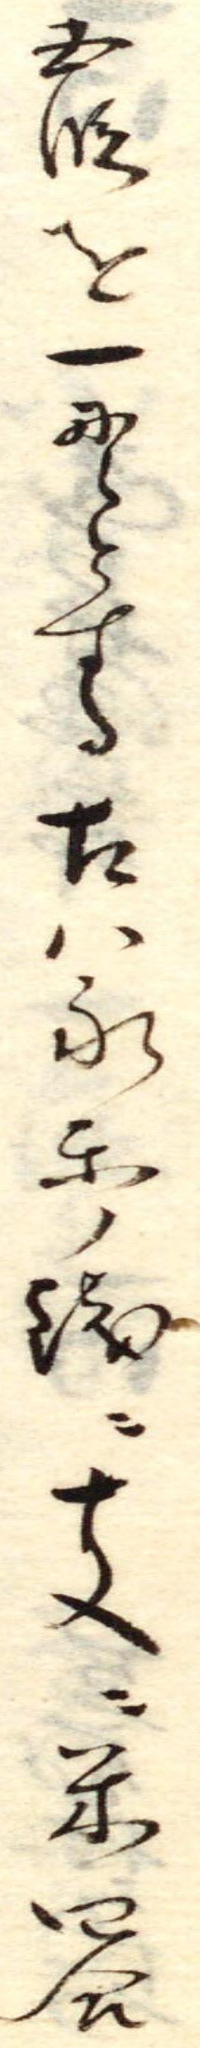五段を一貫とする古は永楽の銭に十文に米四合
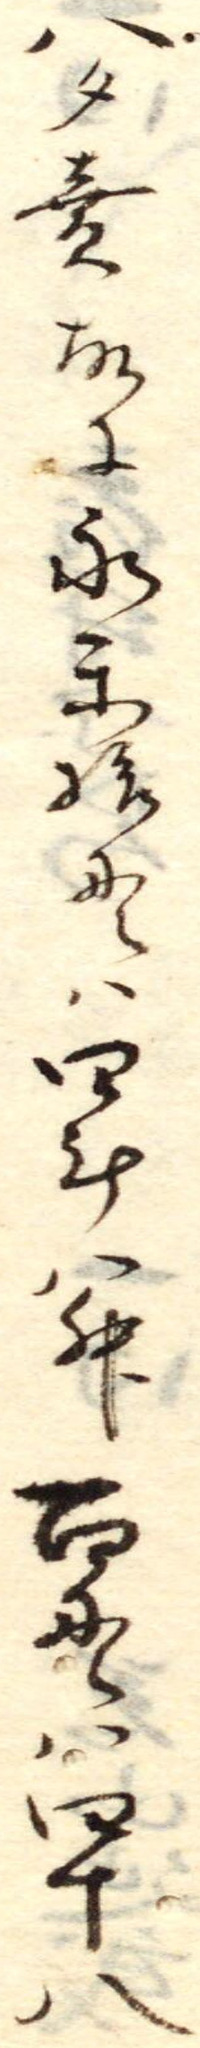八勺売故に永楽拾貫は四斗八升百貫は四十八
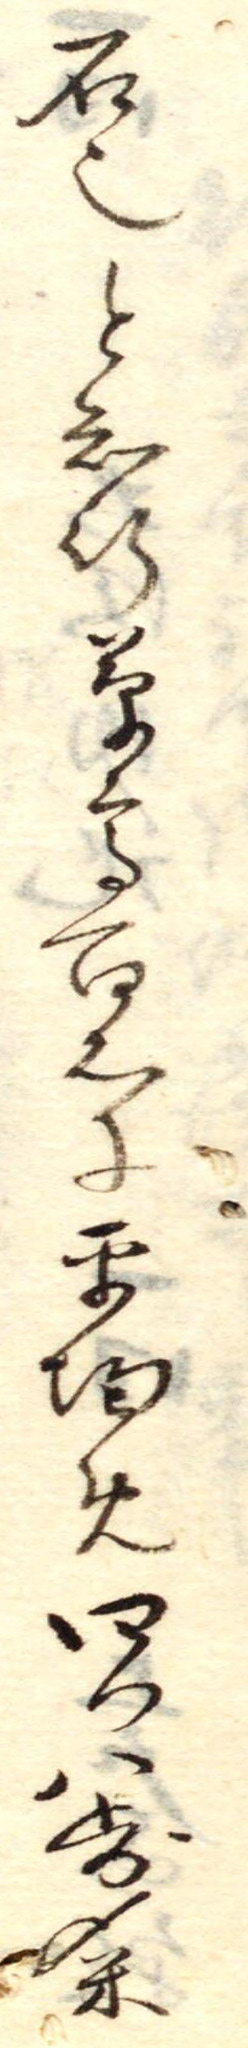石也と知行草高百石平均免四つ八歩〆米
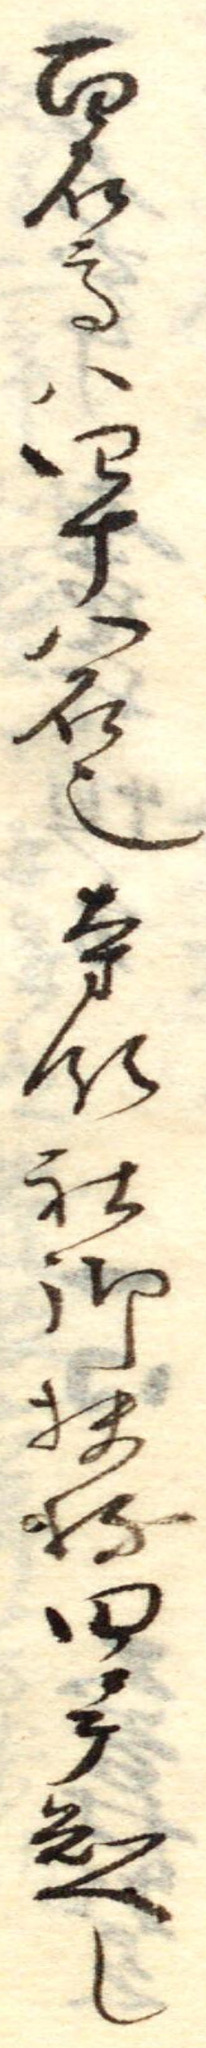百石高は四十八石也寺領社御扶持田にて知へし
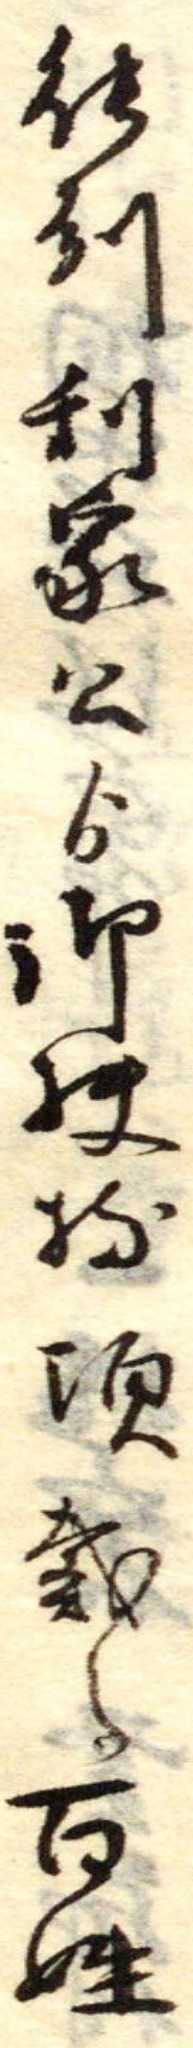能州利家公より御扶持頂戴之百姓
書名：能登名跡誌
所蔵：Ishikawa Prefectural Library
